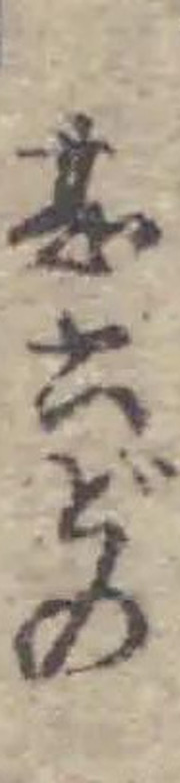甚六どの
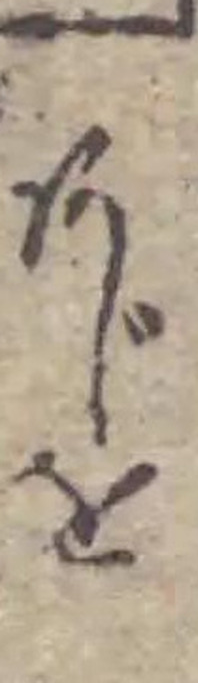あじを
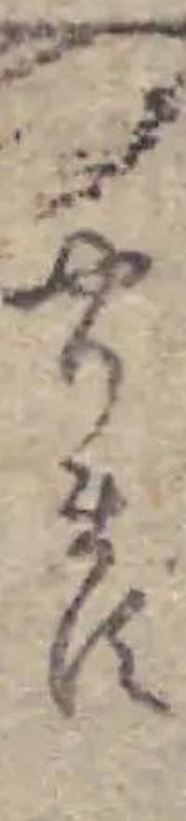やります
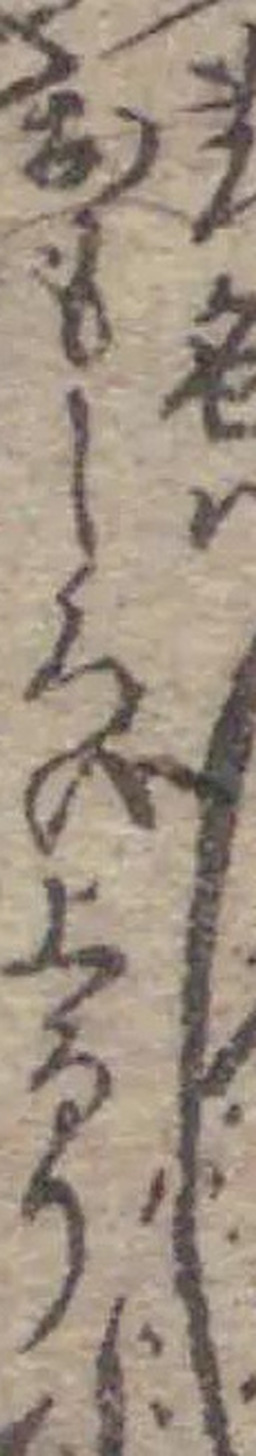おもしろい上るりで
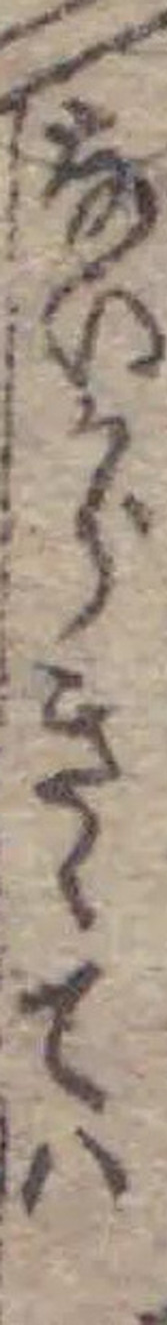ないからきゝては
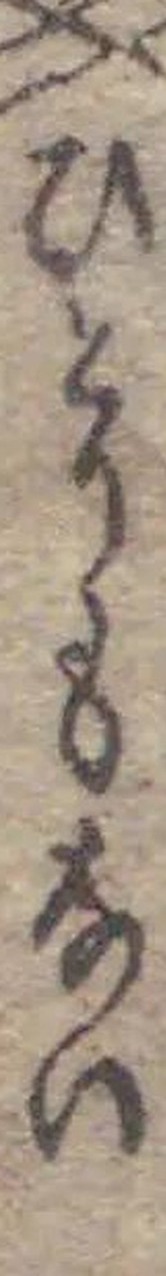ひとりもない

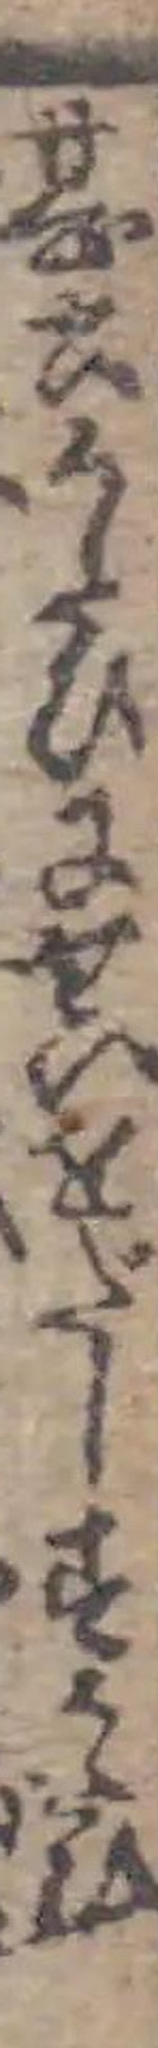甚六うたひにせいをだしすうたひ
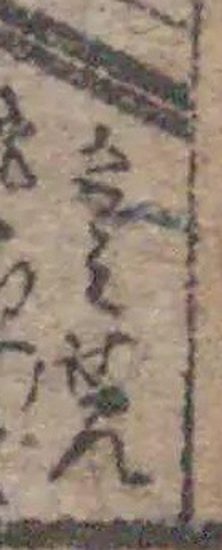さみせん
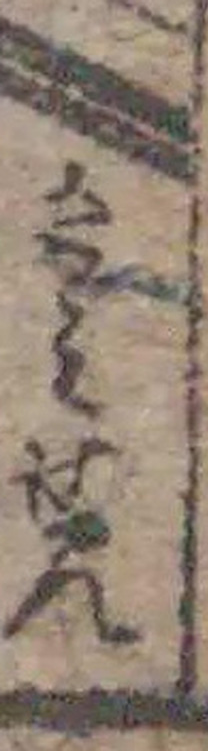さみせん
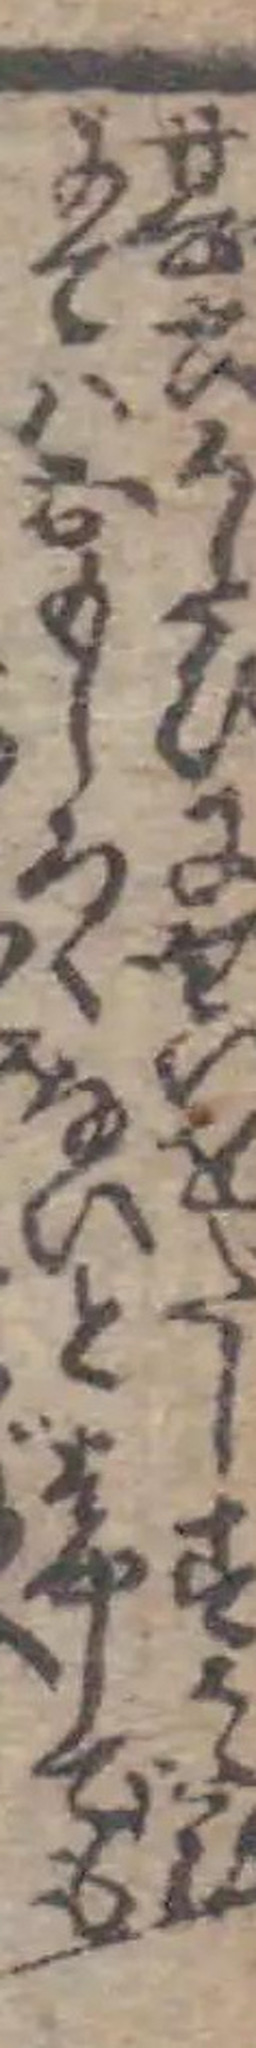にてはおもしろくないとはやしでも
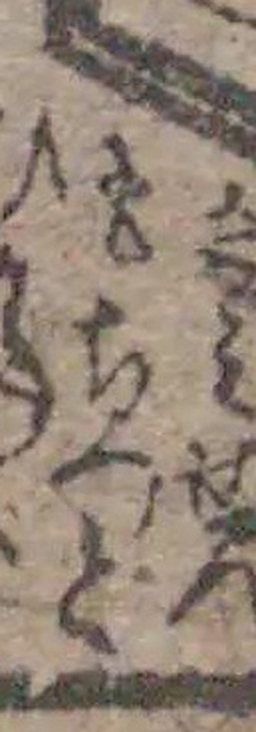もちつと
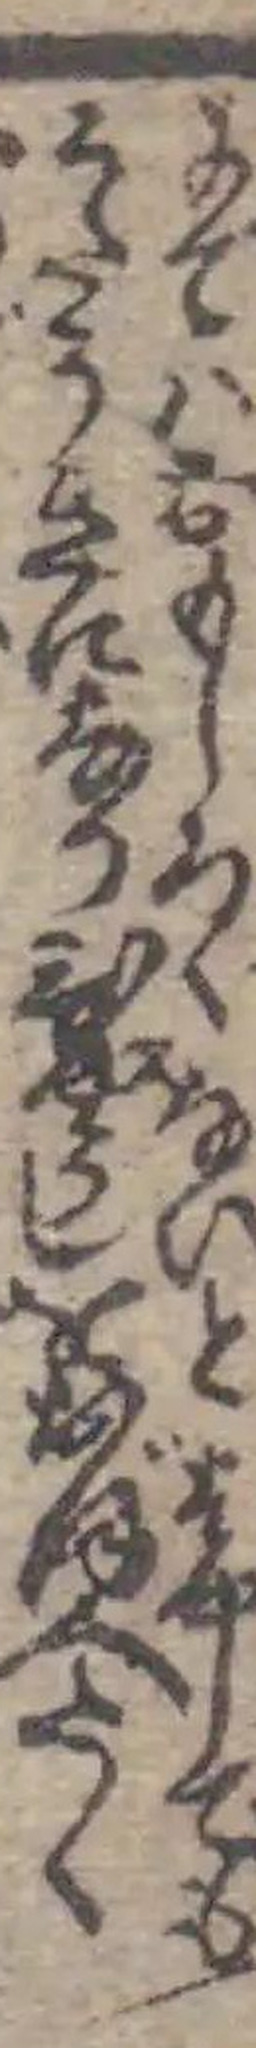うたうきになりひやうしをおぼへとく
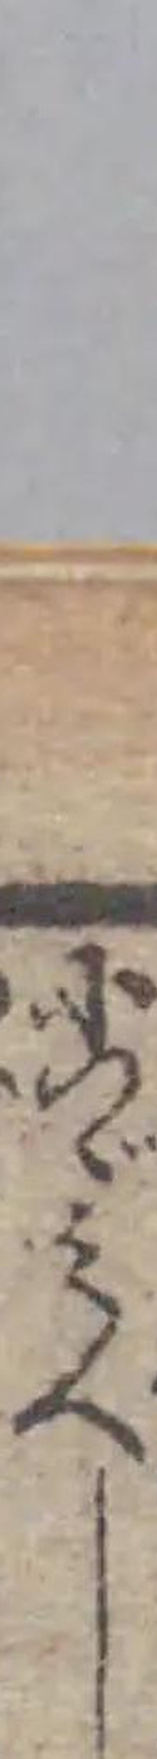小つゞみへ
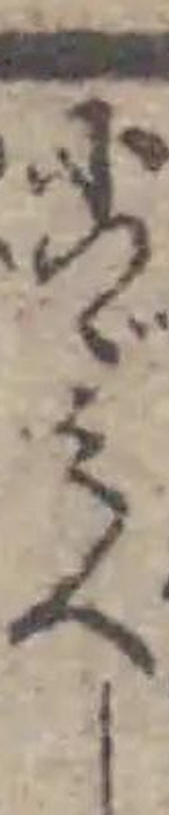小つゞみへ
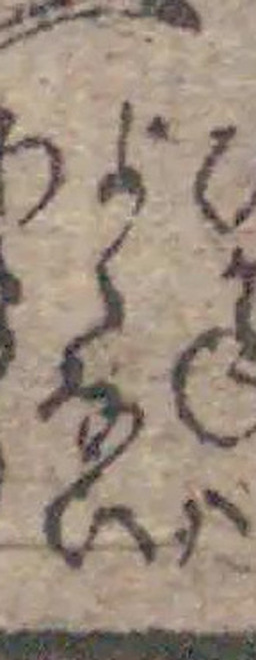よくない
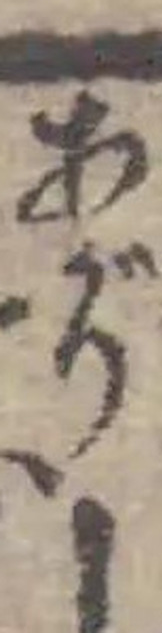あがり
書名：津以曽無弟の甚六 3巻
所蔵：国立国会図書館 National Diet Library, JAPAN
